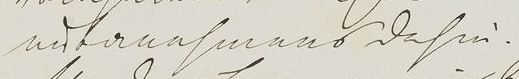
unternehmens dahin. –
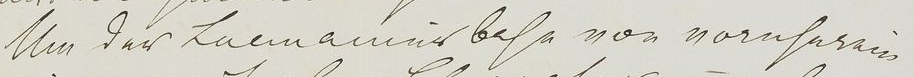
Um der Lucmanierbahn von vornherein
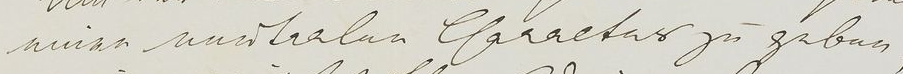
einen neutralen Character zu geben,
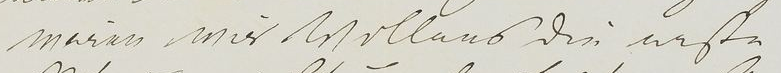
wären wir Willens die erste
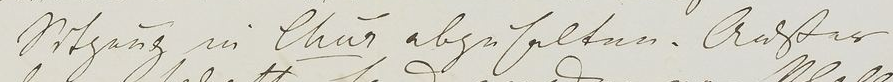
Sitzung in Chur abzuhalten. Außer
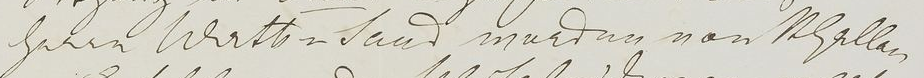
Herrn Wirth-Sand werden von St. Gallen
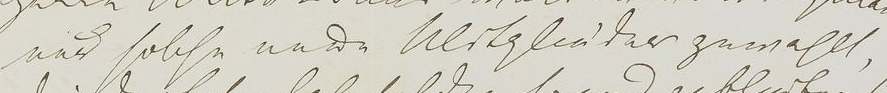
nur solche neue Mitglieder gewählt,
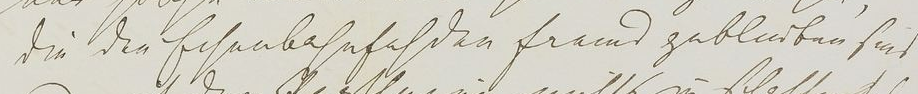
die den Eisenbahnfehden fremd geblieben sind
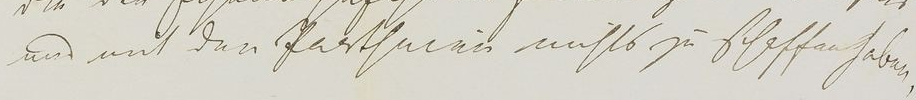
und mit den Partheien nichts zu schaffen haben,
